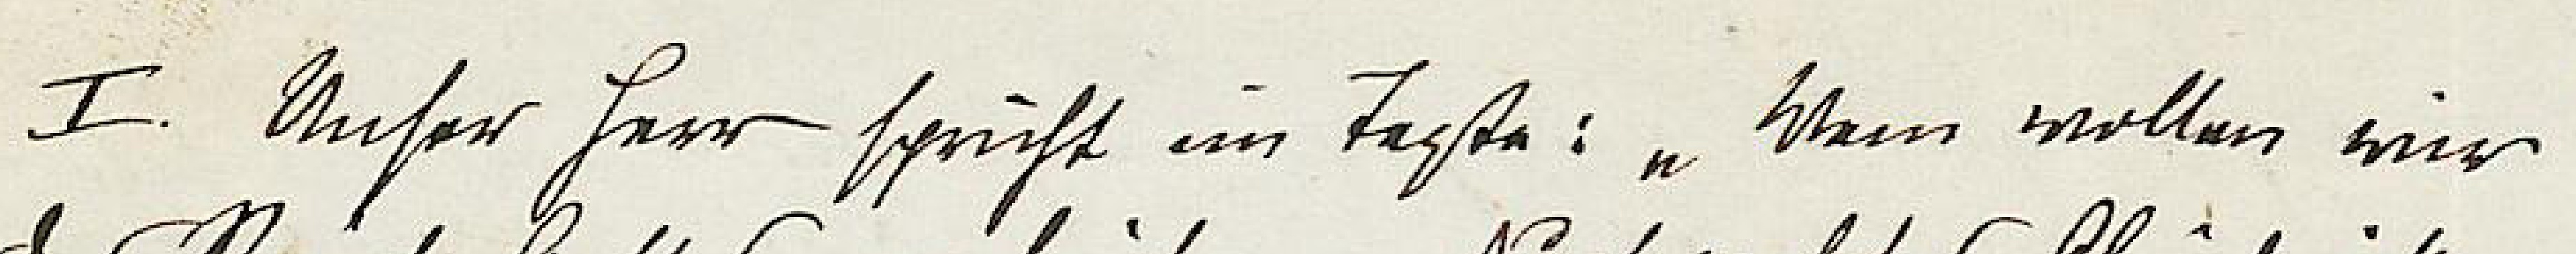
I. Unser Herr spricht im Texte: "Wem wollen wir
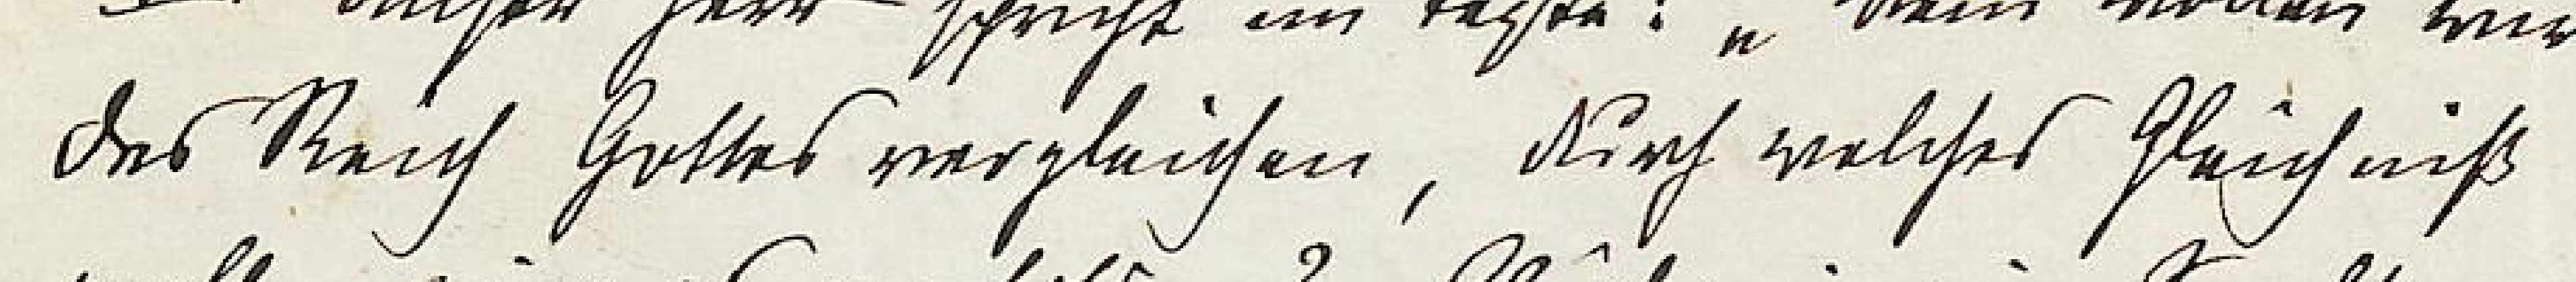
das Reich Gottes vergleichen, durch welches Gleichniß
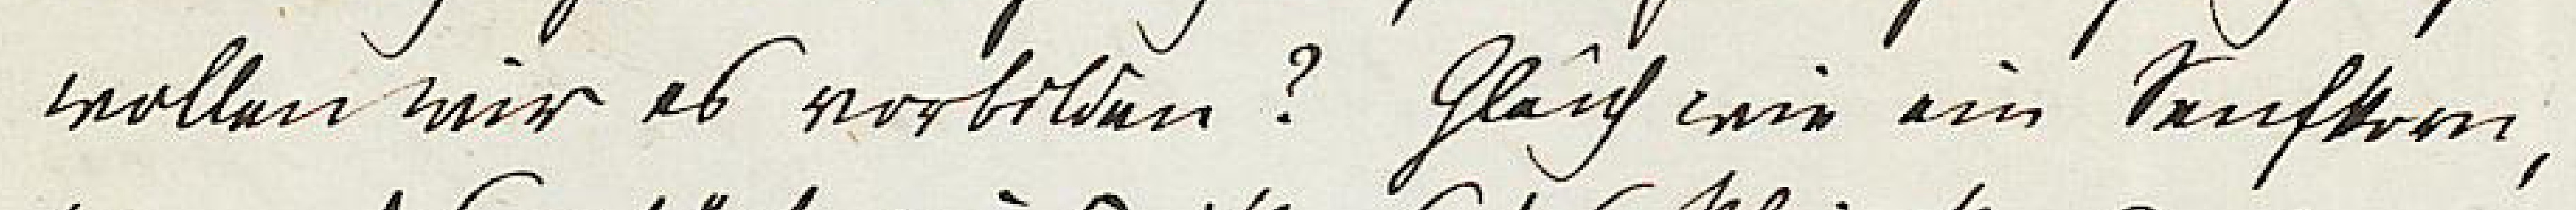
wollen wir es vorbilden? Gleich wie ein Senfkorn,
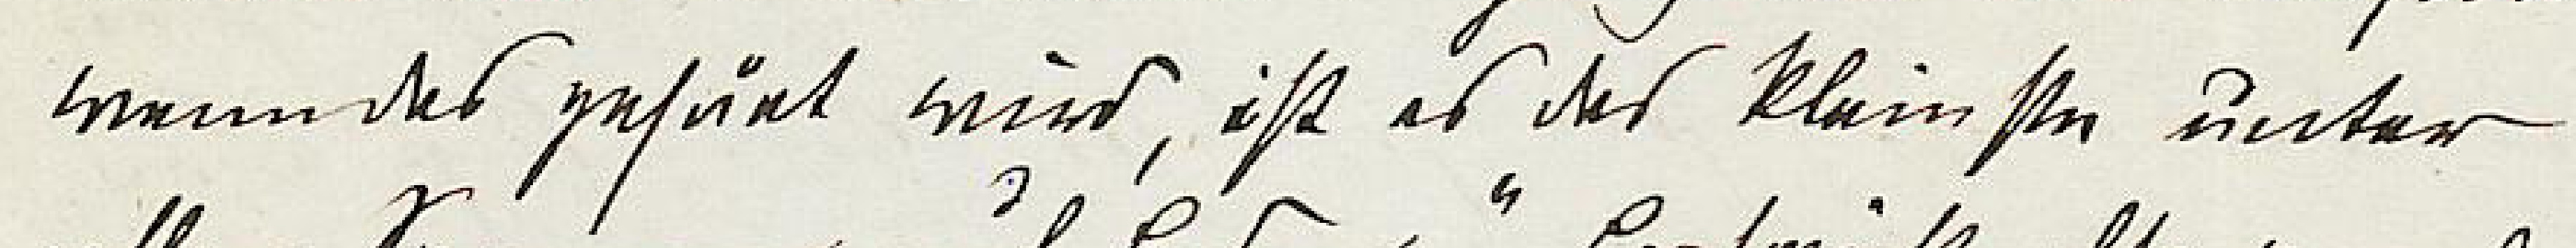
wenn das gesäet wird, ist es das kleinste unter
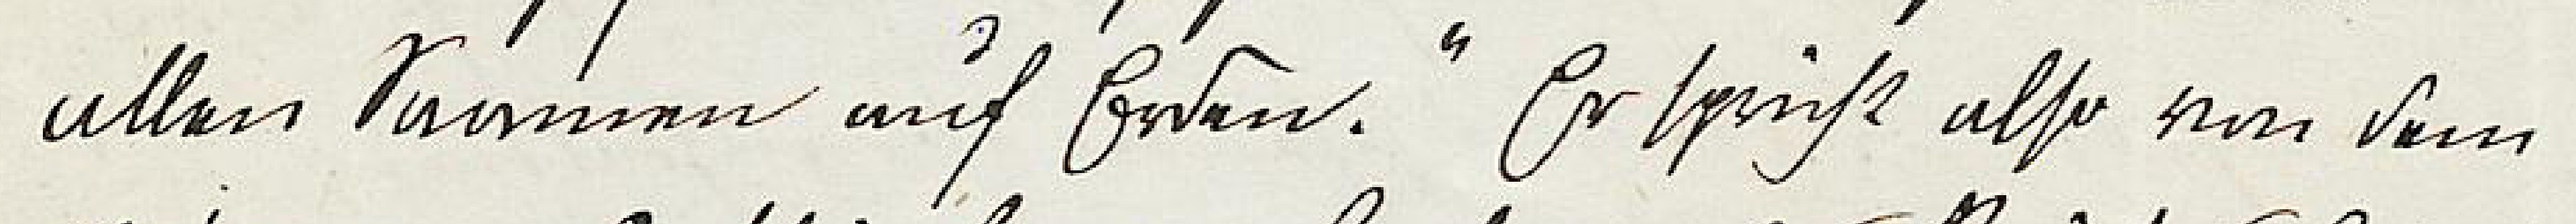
allen Samen auf Erden." Er spricht also von dem
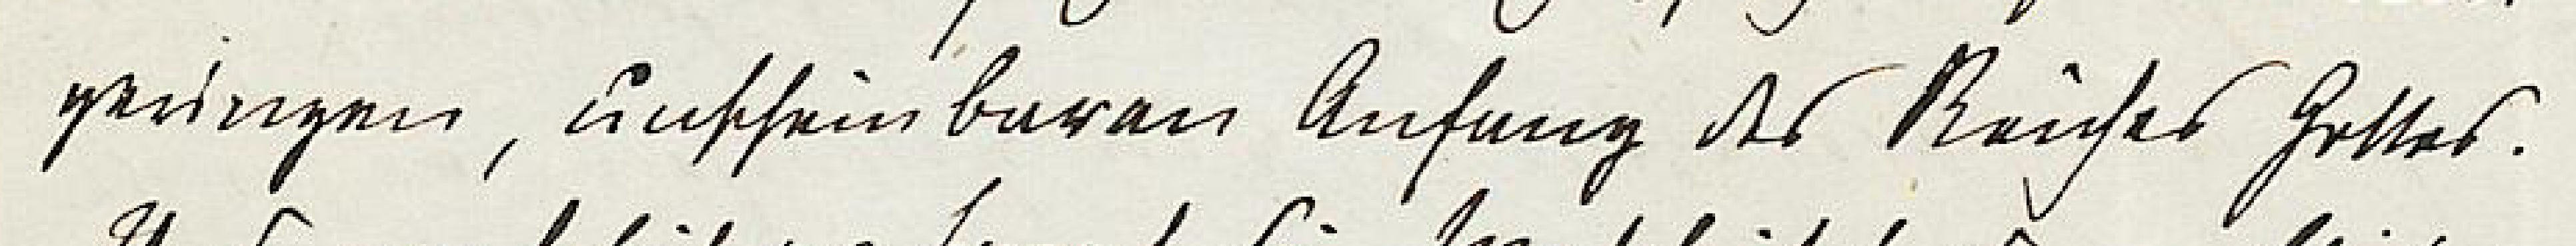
geringen, unscheinbaren Anfang des Reiches Gottes.
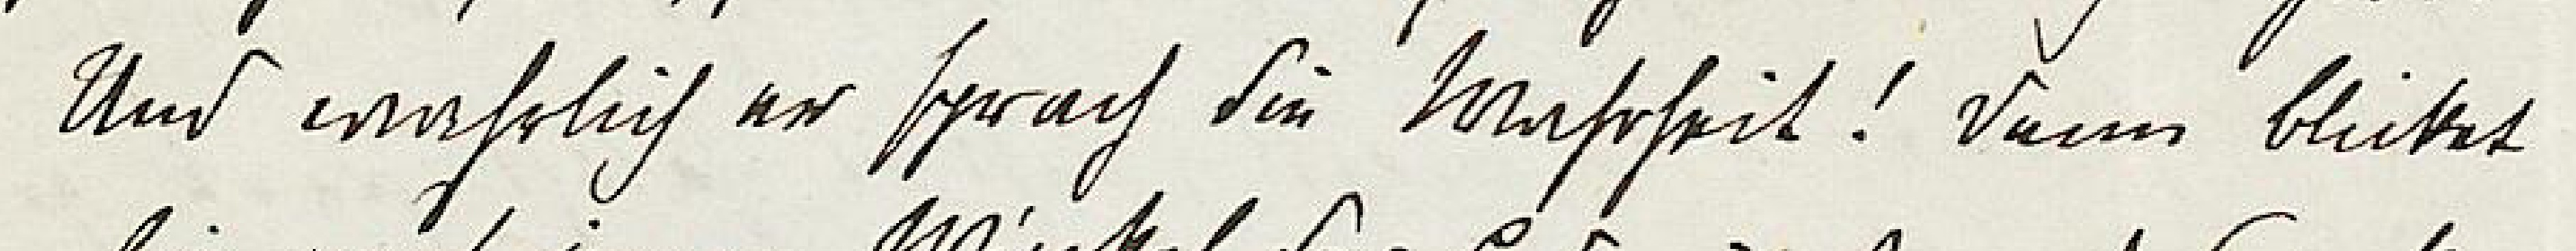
Und wahrlich er sprach die Wahrheit! Denn blicket
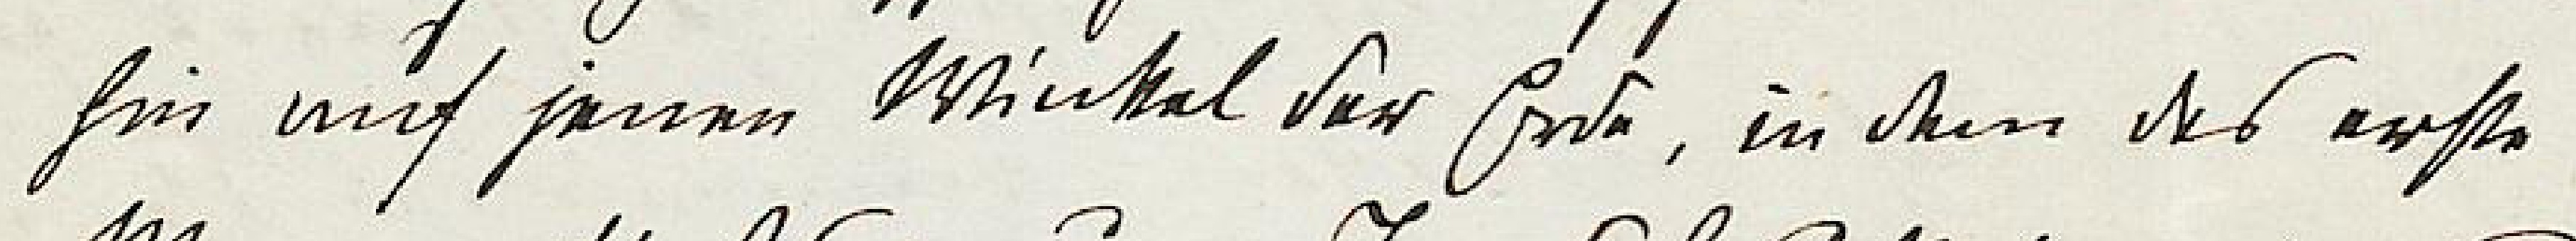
hin auf jenen Winkel der Erde, in dem das erste
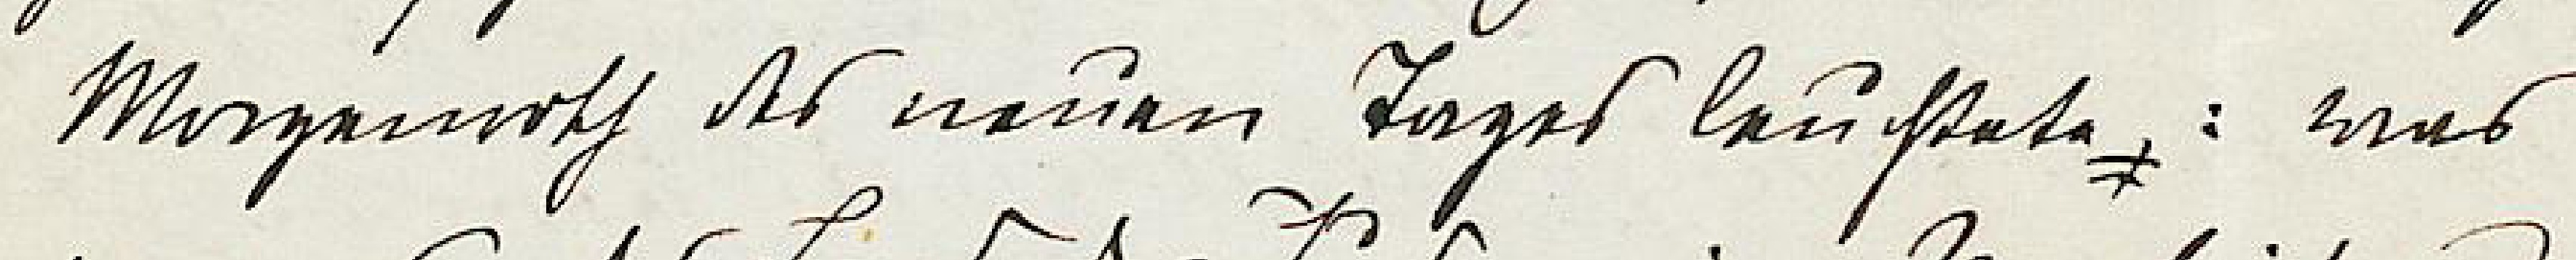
Morgenroth des neuen Tages leuchtete,: was
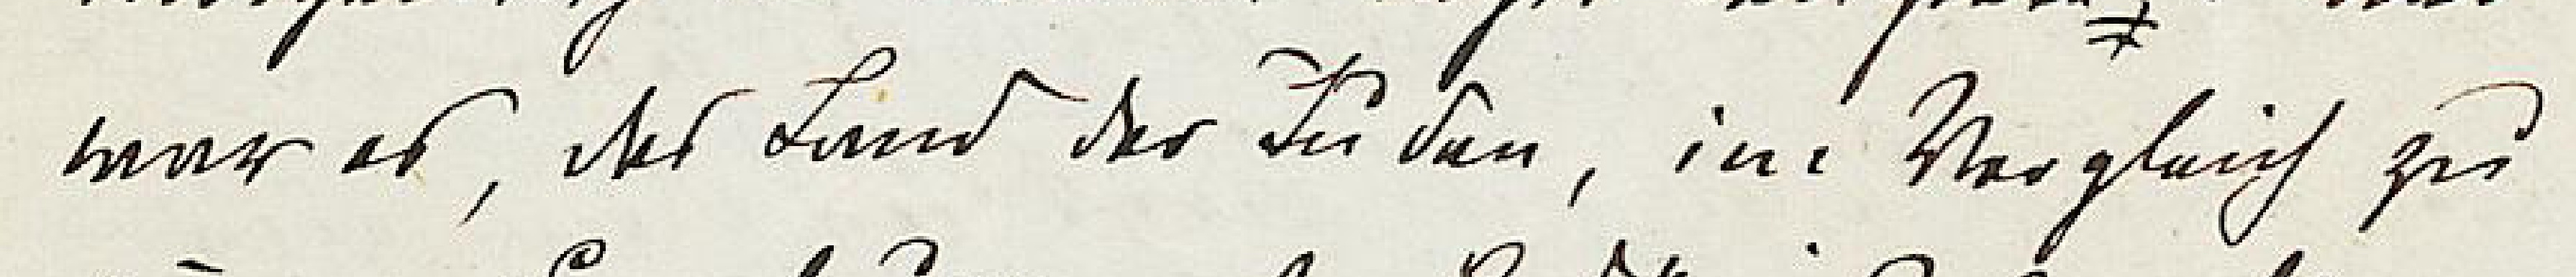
war es, das Land der Juden, im Vergleich zu
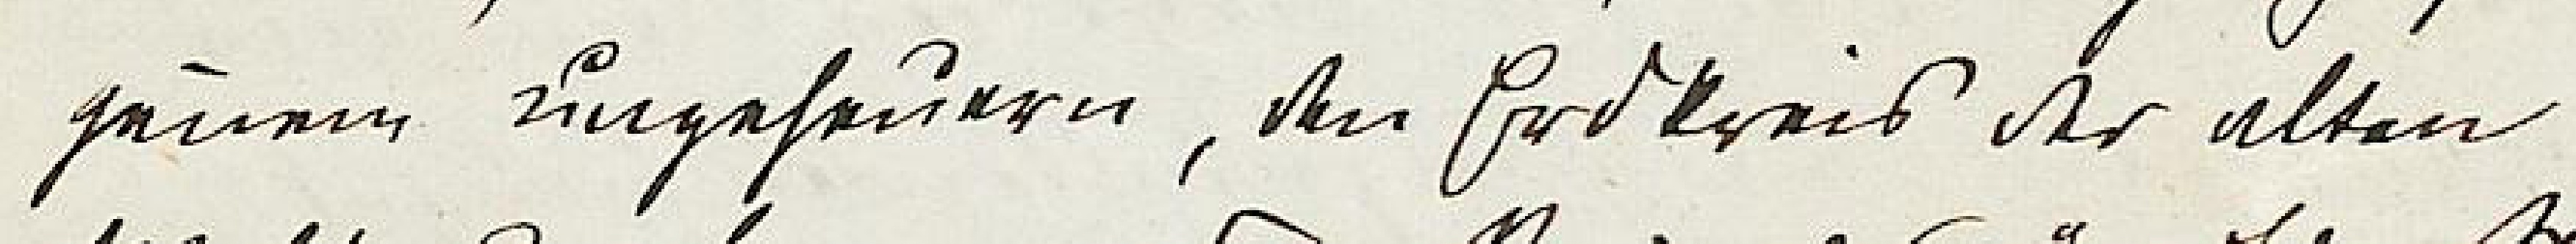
jenem ungeheuern, den Erdkreis der alten
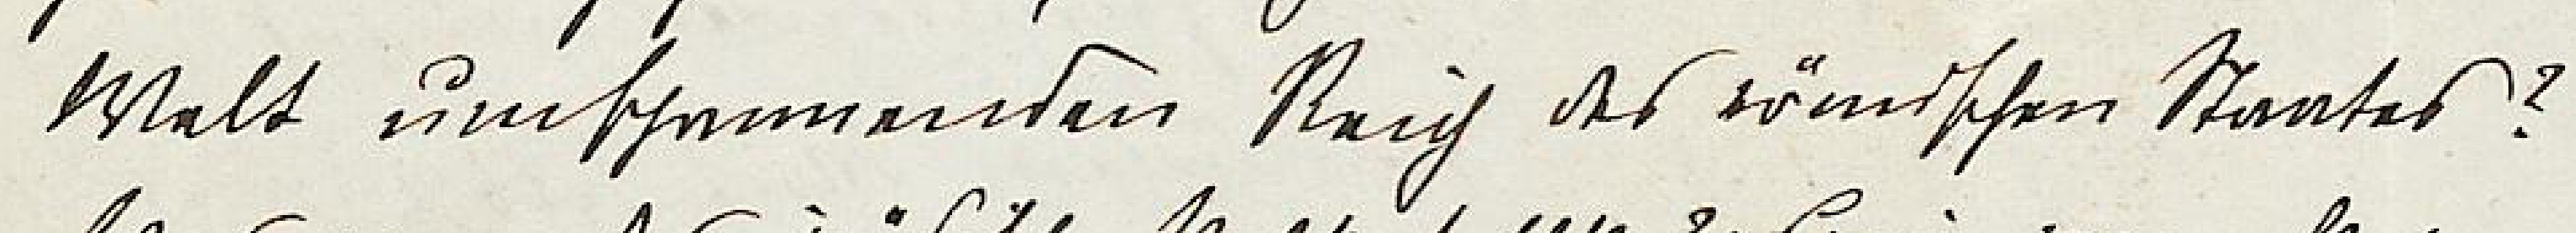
Welt umspannenden Reich des römischen Staates?
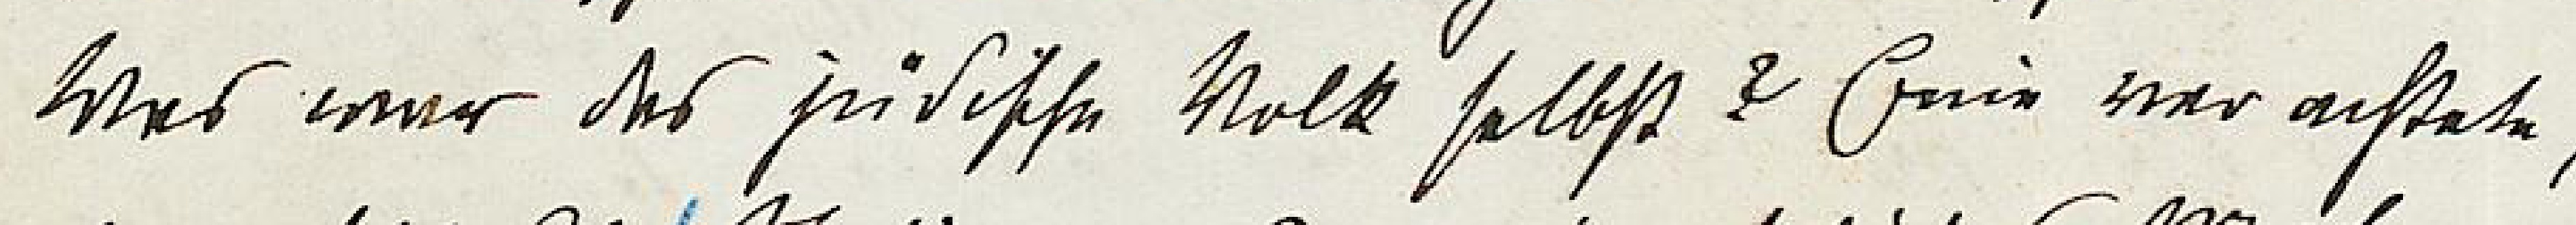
Was war das jüdische Volk selbst? Eine verachtete,
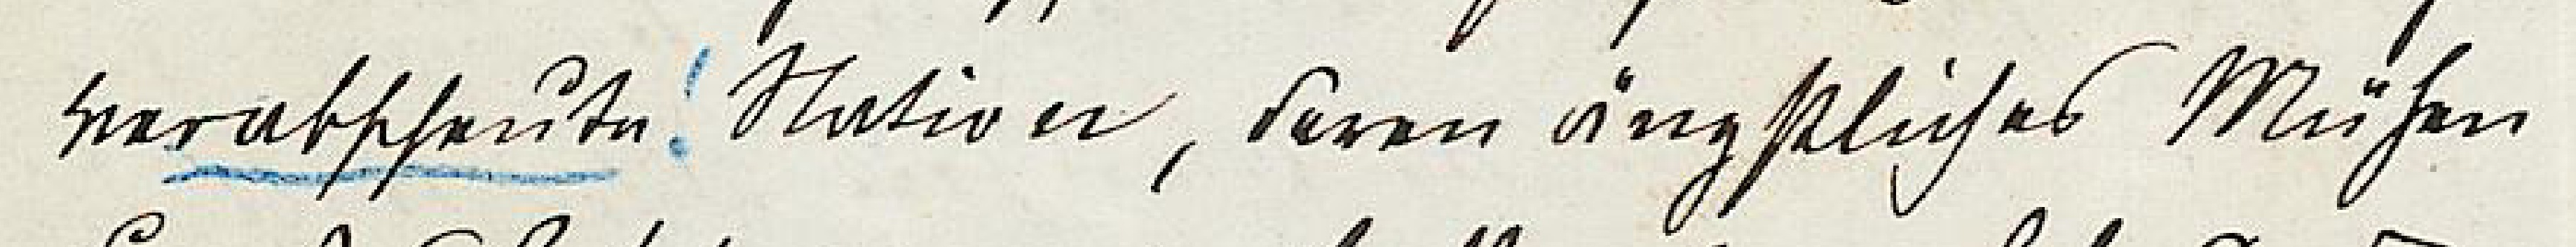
verabscheute! Nation, deren ängstliches Mühen
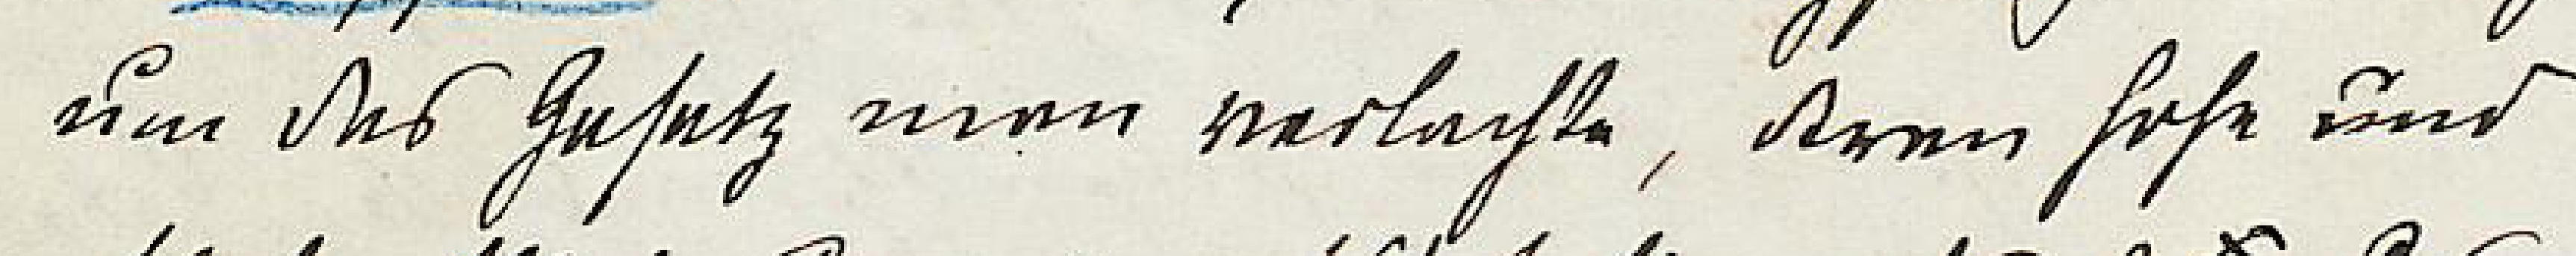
um das Gesetz man verlachte, deren hohe und
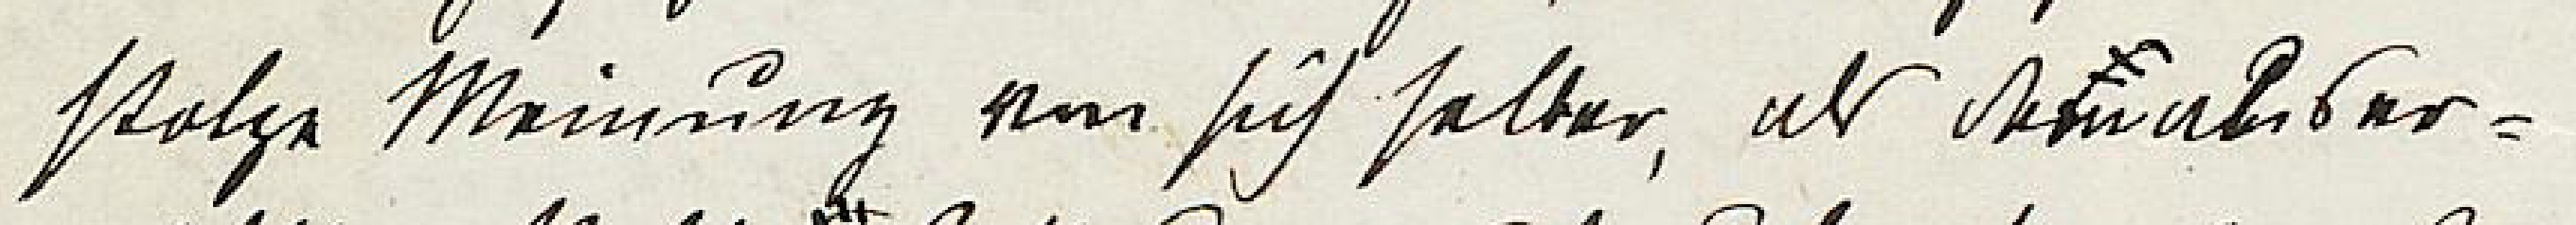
stolze Meinung von sich selber, als desm auser¬
